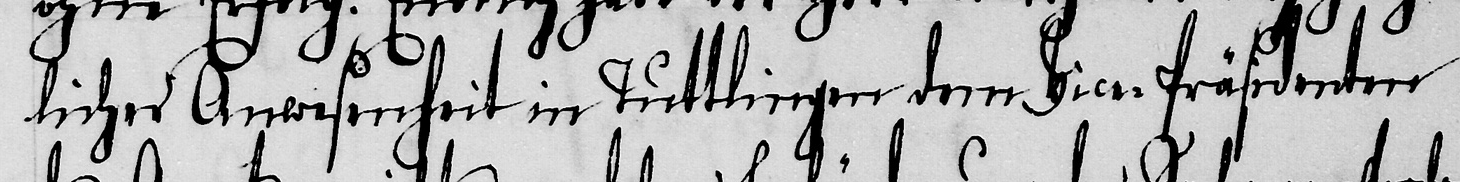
licher Anwesenheit in Tuttlingen dem Vice-Präsidenten
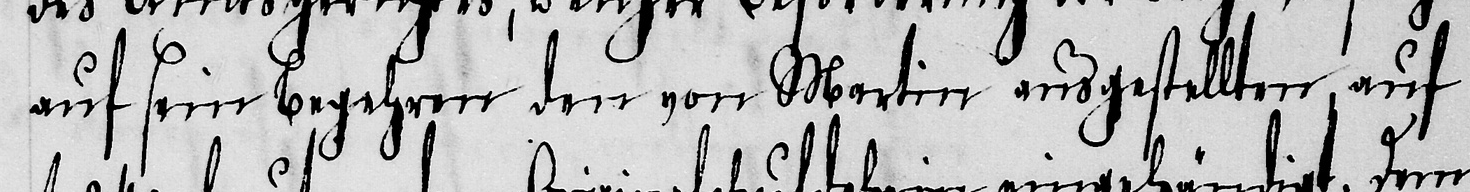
auf sein Begehren den von Martin ausgestellten auf
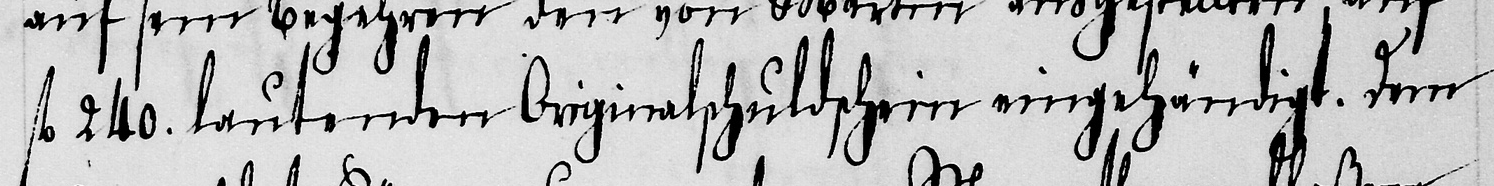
fl. 240 lautenden Originalschuldschein eingehändigt. Dem
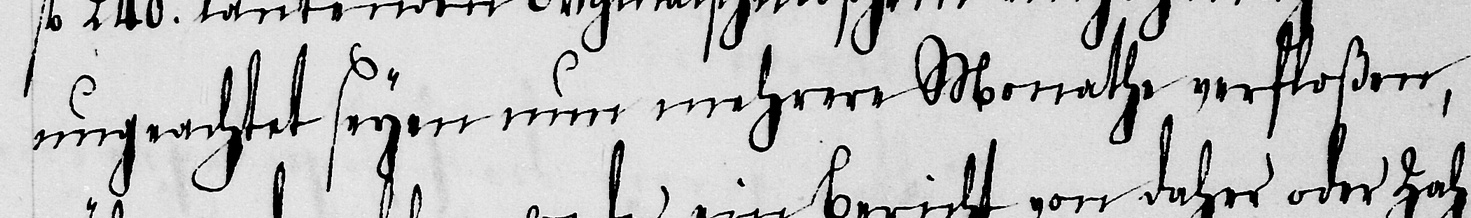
ungeachtet seyen nun mehrere Monathe verfloßen,
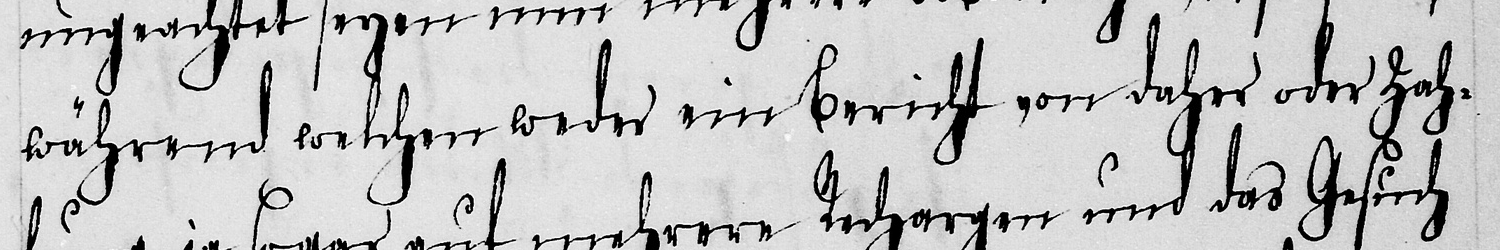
während welchen weder ein Bericht von daher oder Zah¬
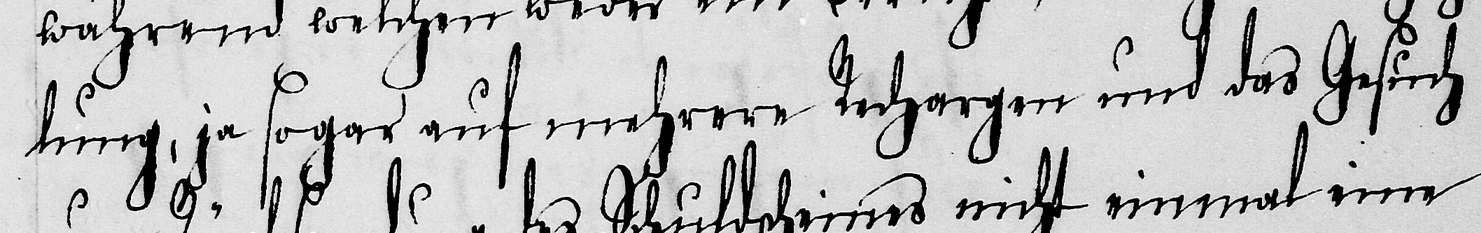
lung, ja sogar auf mehrere Rechargen und das Gesuch
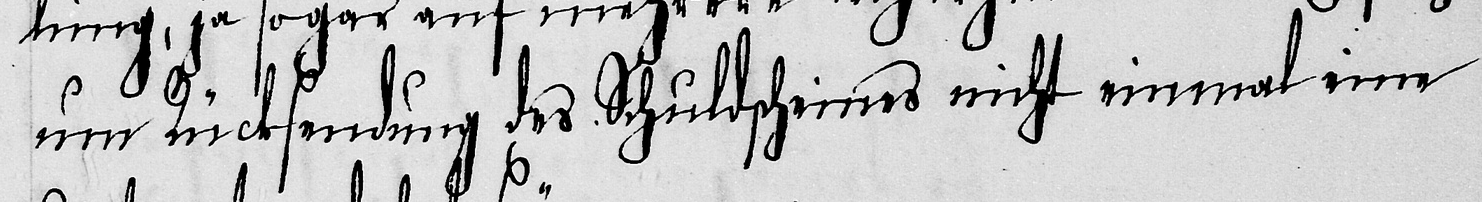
um Rücksendung des Schuldscheines nicht einmal eine
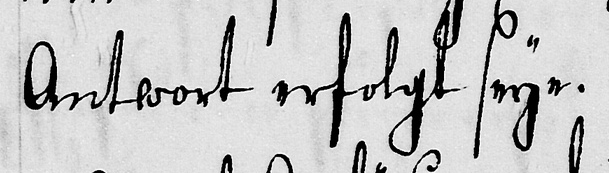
Antwort erfolgt seye.
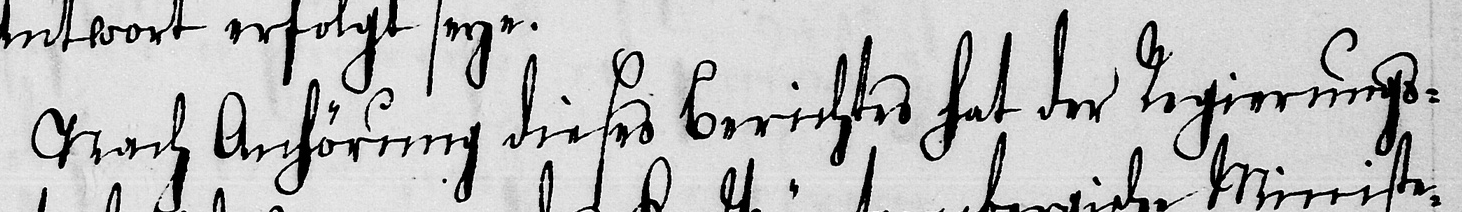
Nach Anhörung dieses Berichtes hat der Regierungs¬
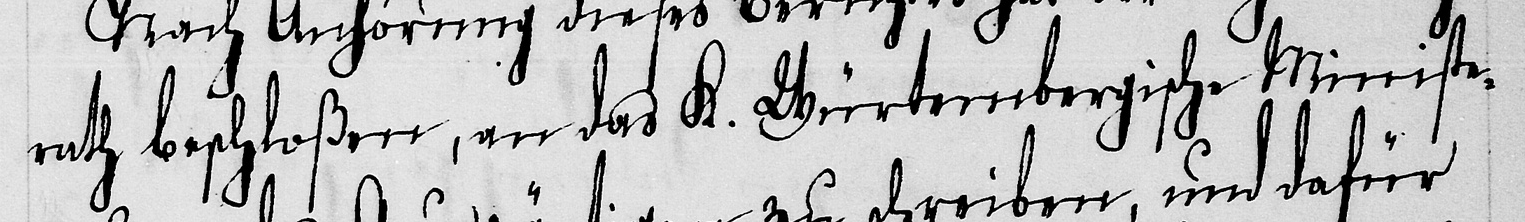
rath beschloßen, an das K. Würtembergische Ministe¬
